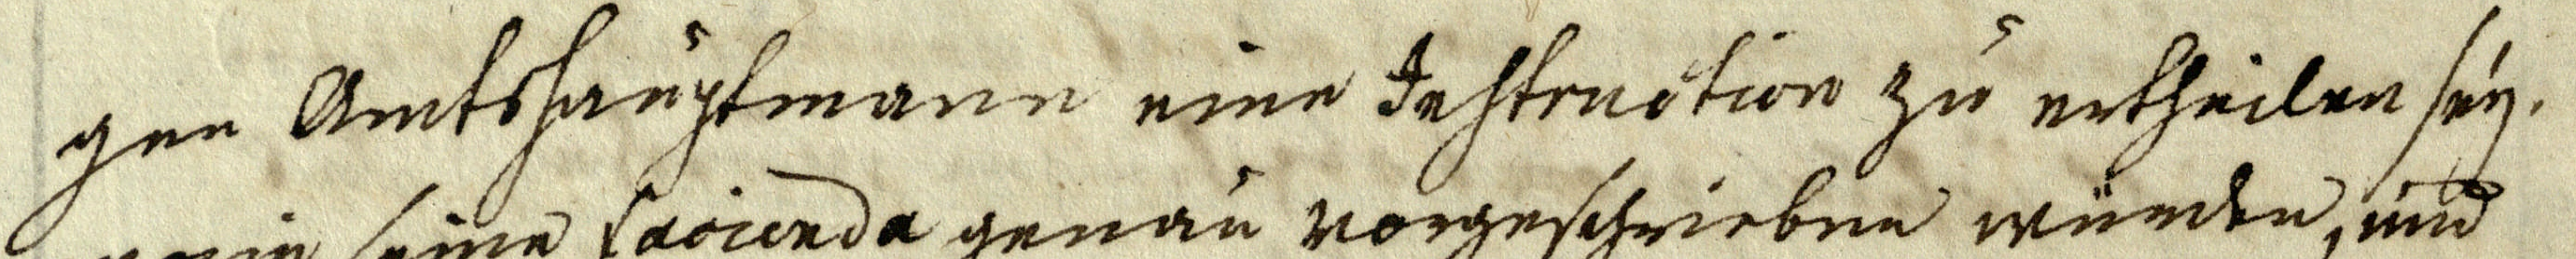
gen Amtshauptmann eine Instruction zu ertheilen seÿ,
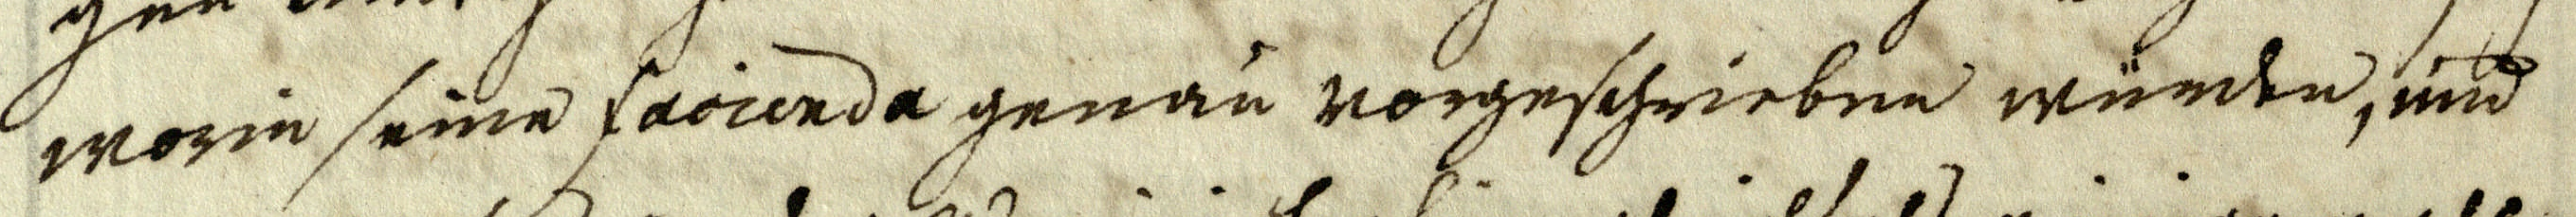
worin seine facienda genau vorgeschrieben würden, und
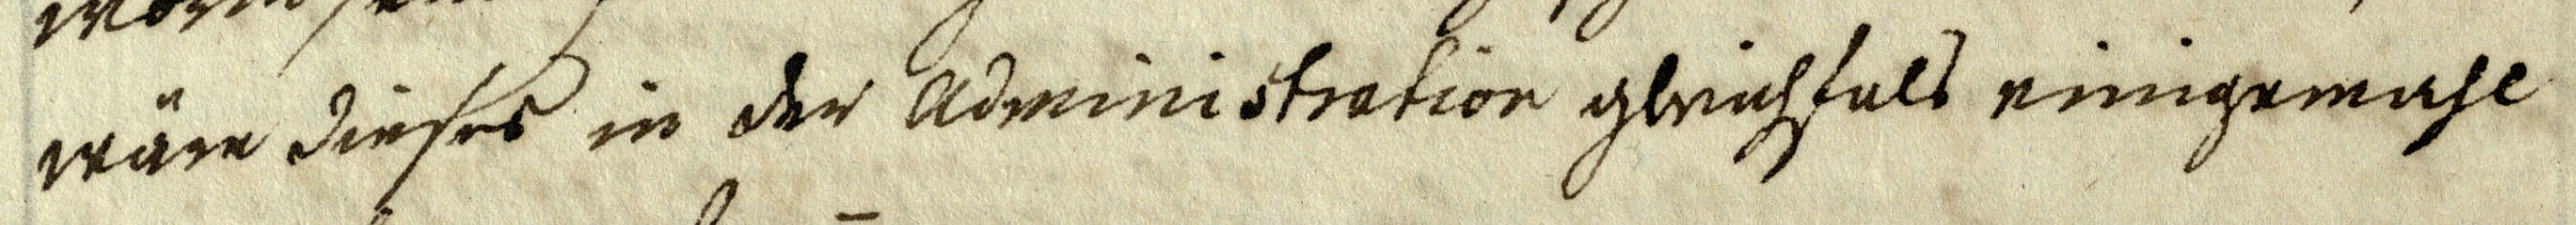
wäre dieses in der Administration gleichfals einigemahl
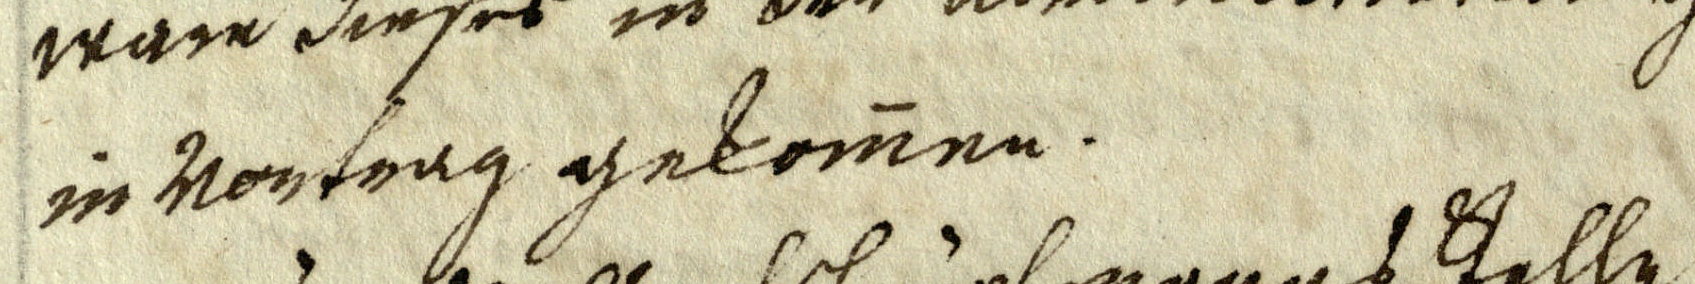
in Vortrag gekomen.
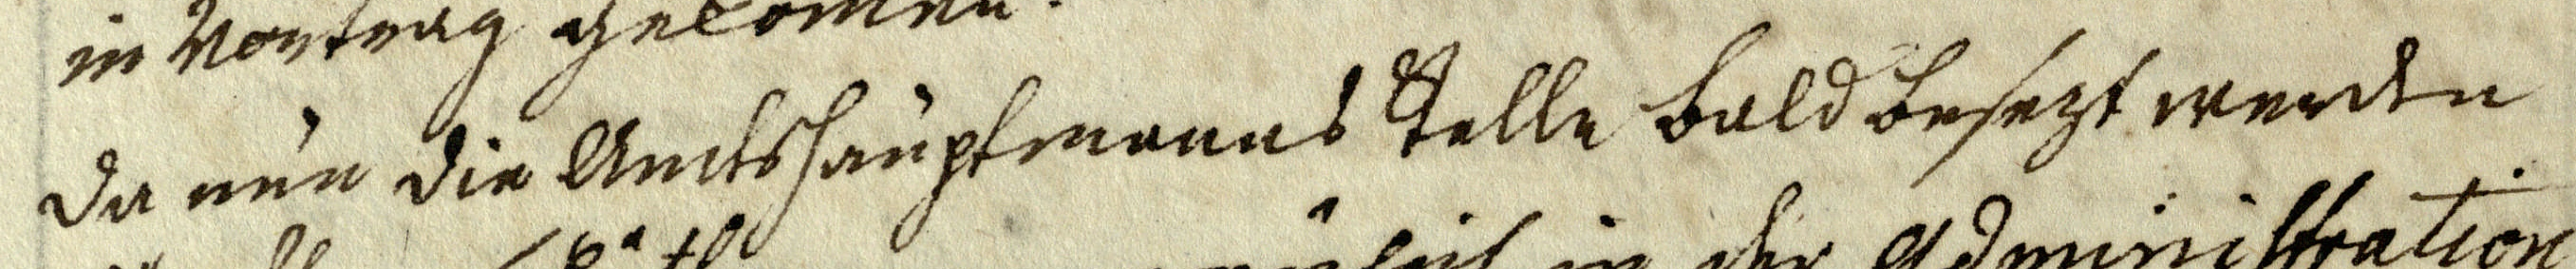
Da nun die Amtshauptmanns Stelle bald besezt werden
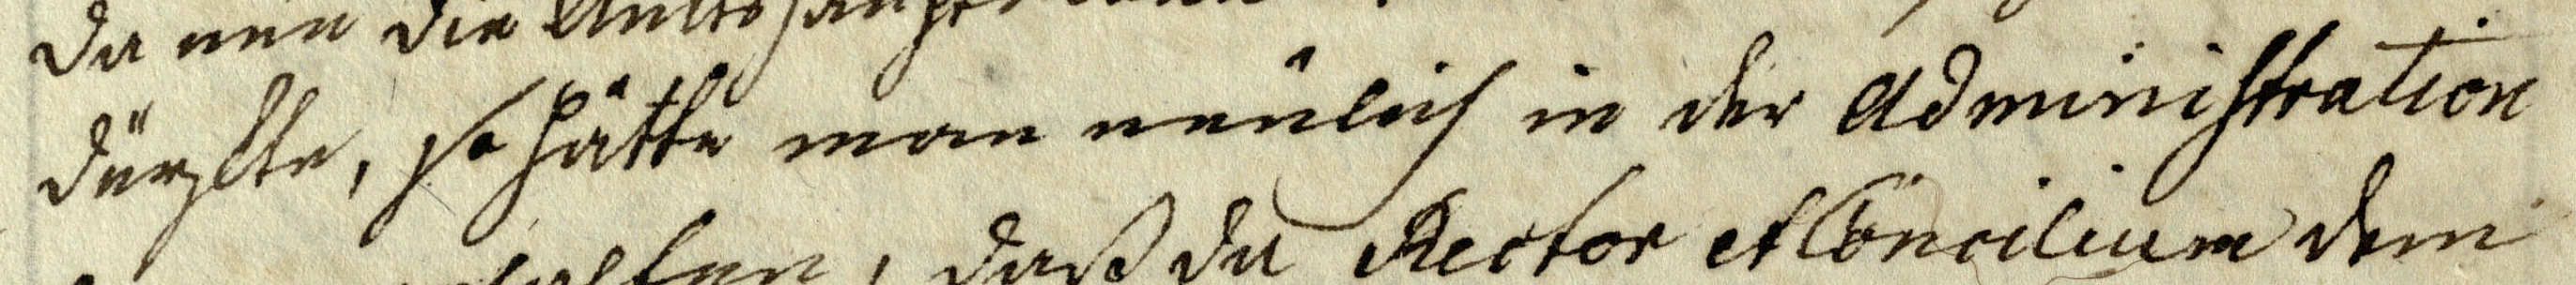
dürfte, so hätte man neulich in der Administration
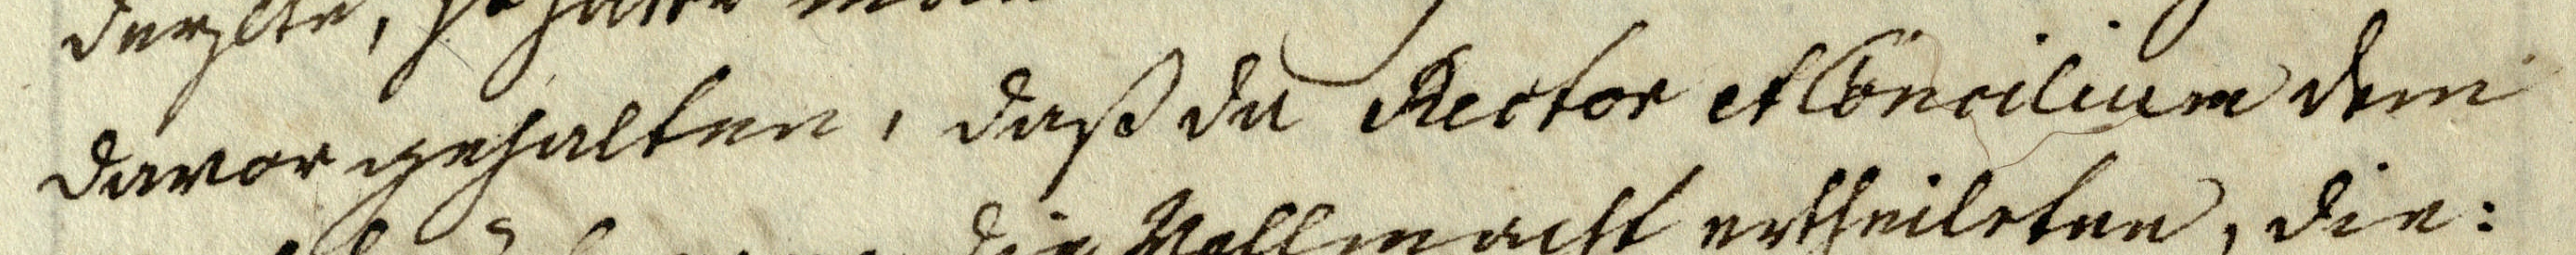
davor gehalten, daß der Rector et Concilium dem
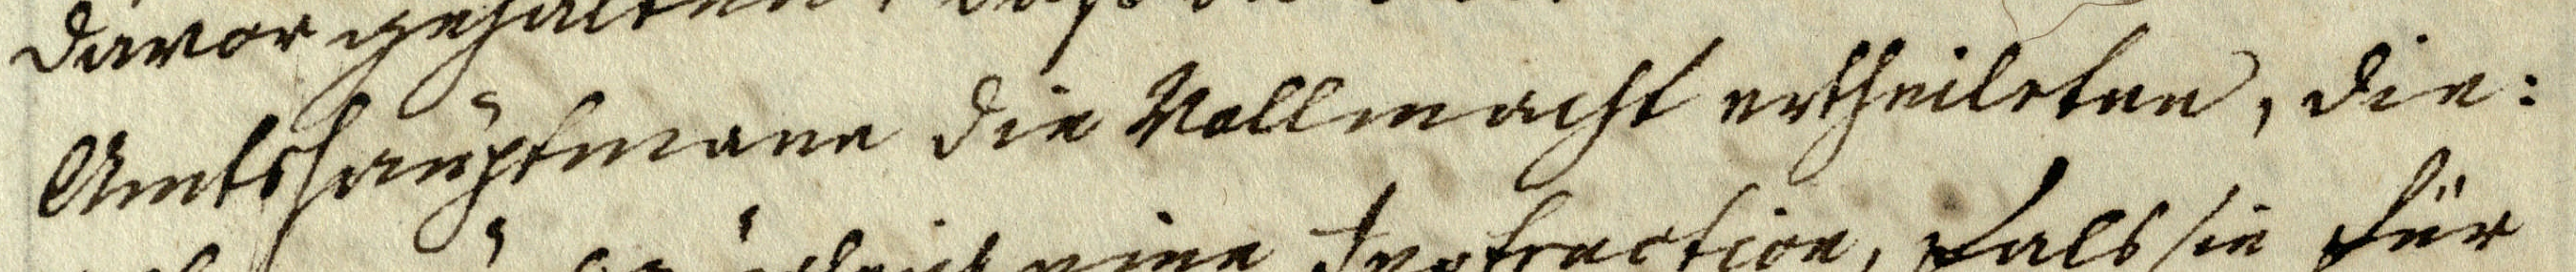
Amtshauptmann die Vollmacht ertheileten, die¬
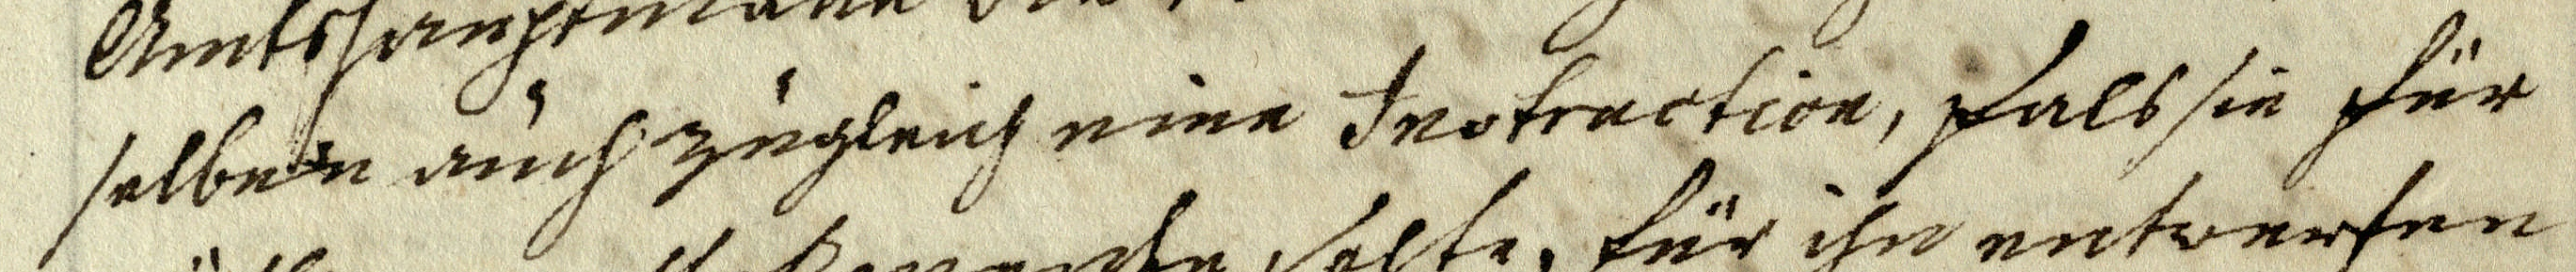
selben auch zugleich eine Instruction, fals sie für
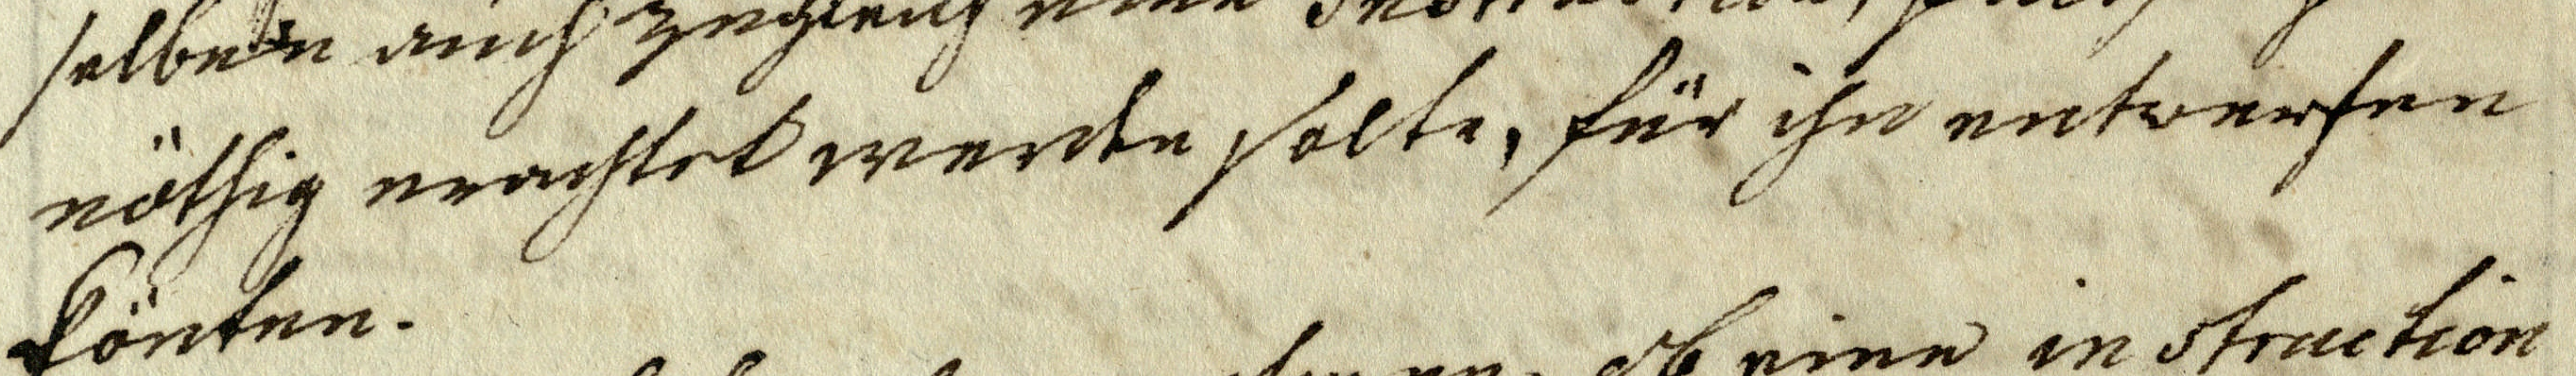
nöthig erachtet werden solte, für ihn entwerfen
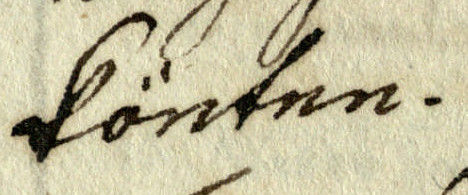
könten.
